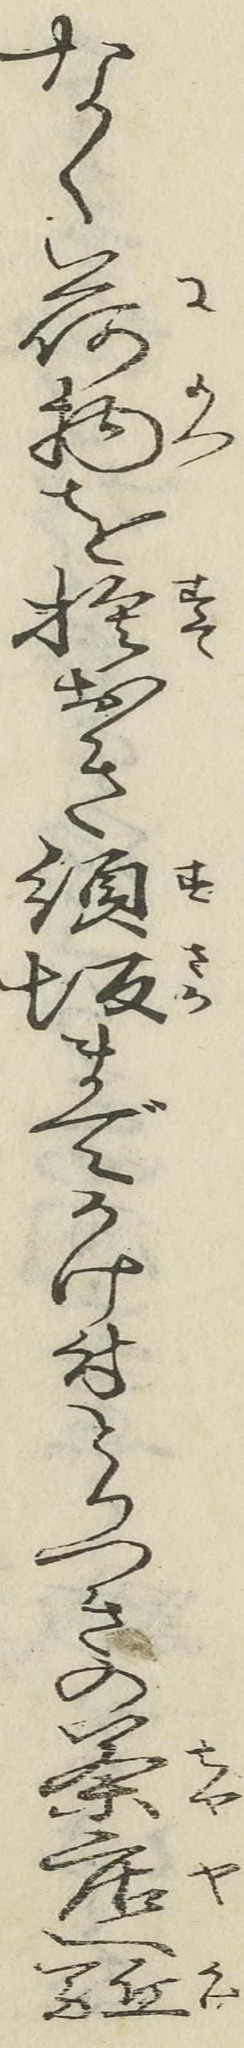なく荷物を捨おき須坂までかけ付とりつきの茶屋へ駈
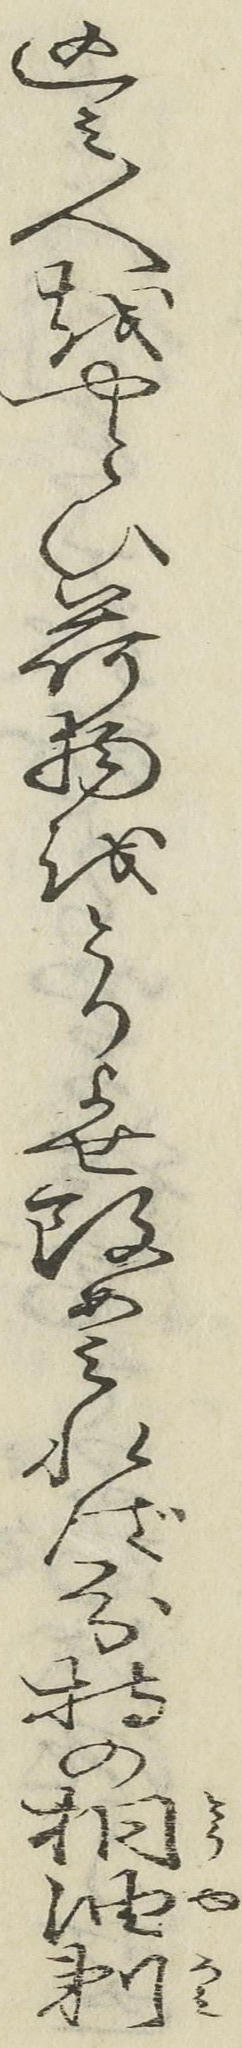込み人をやとひ荷物をとりよせ改めみれば分持の桐油剃
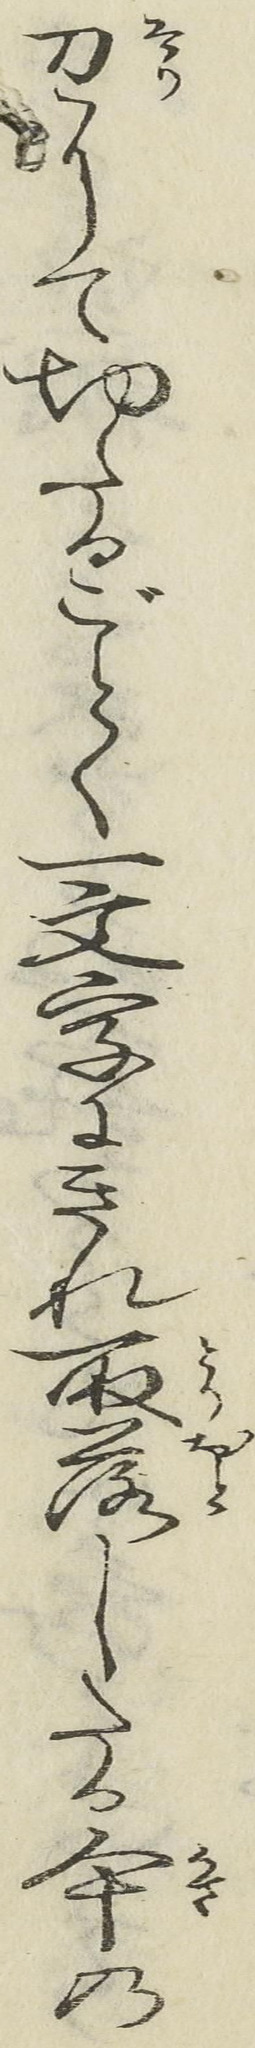刀にて切たるごとく一文字にきれ取落したる傘の
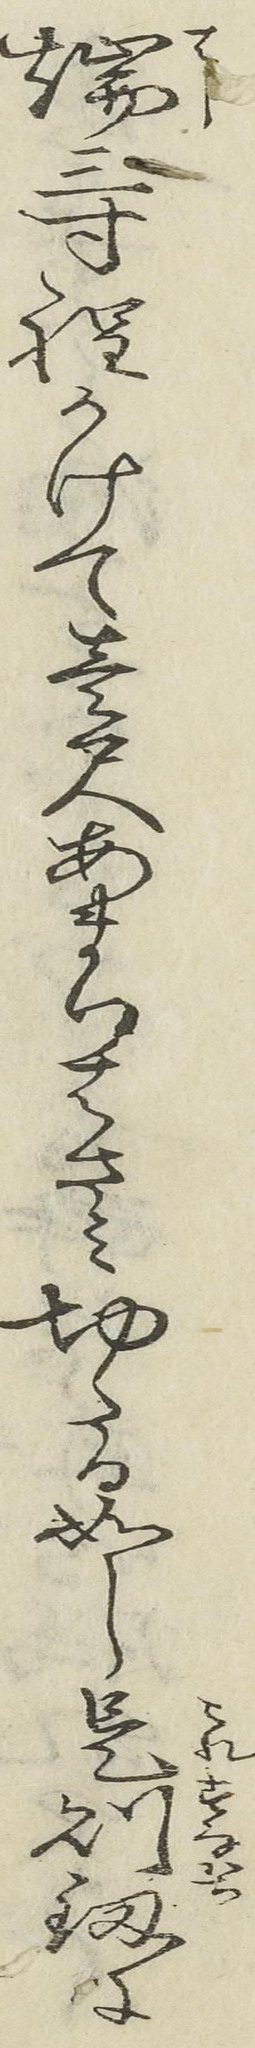端三寸程かけて壱尺あまりはさみ切たる如し是則釼に
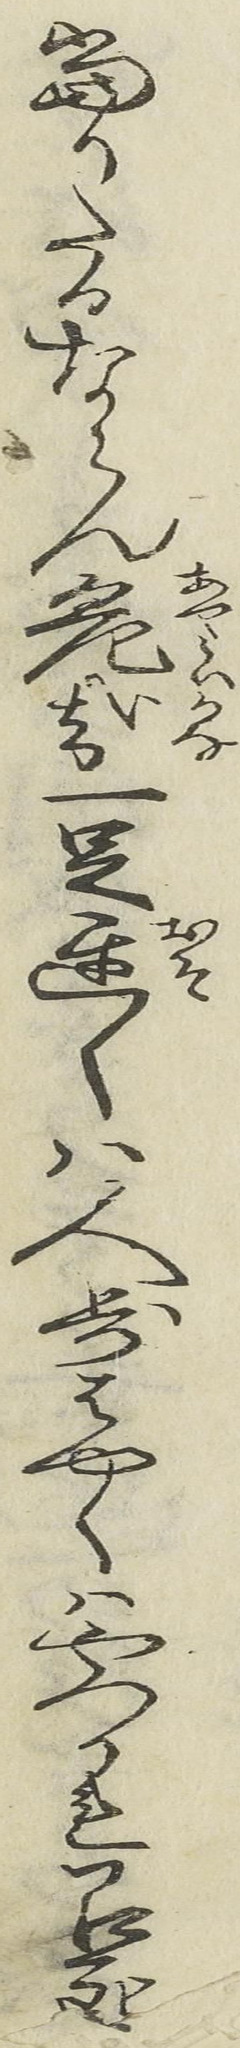当りたるならん危哉一足遅くは人歩はゆくはやつかれ即死

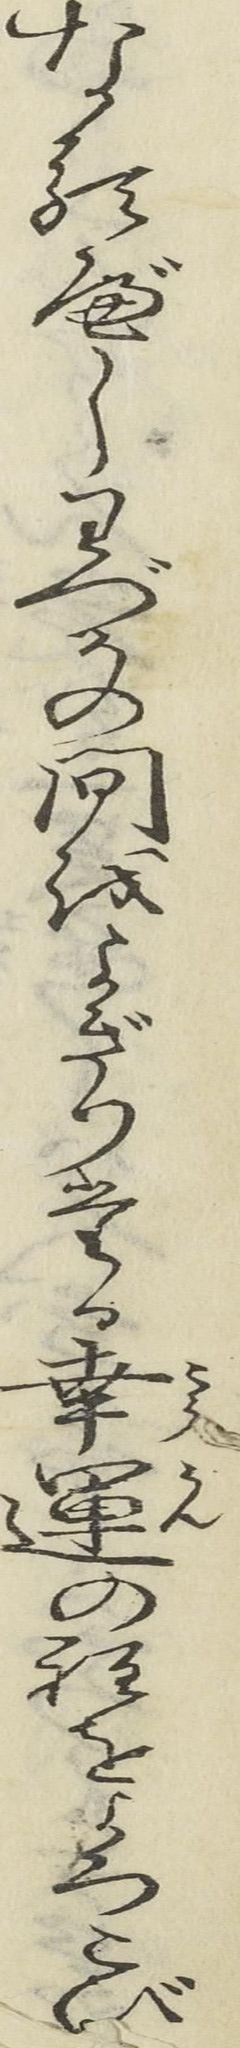なるべしわづかの間をよぎりてか幸運の程をよろこび
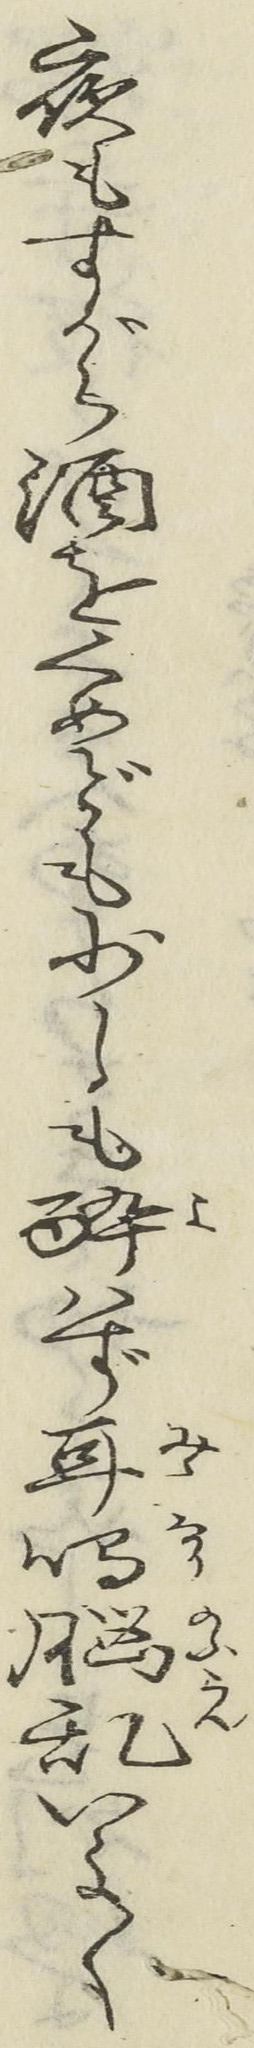夜もすがら酒をくめども少しも酔はず耳鳴脳乱いよ〳〵
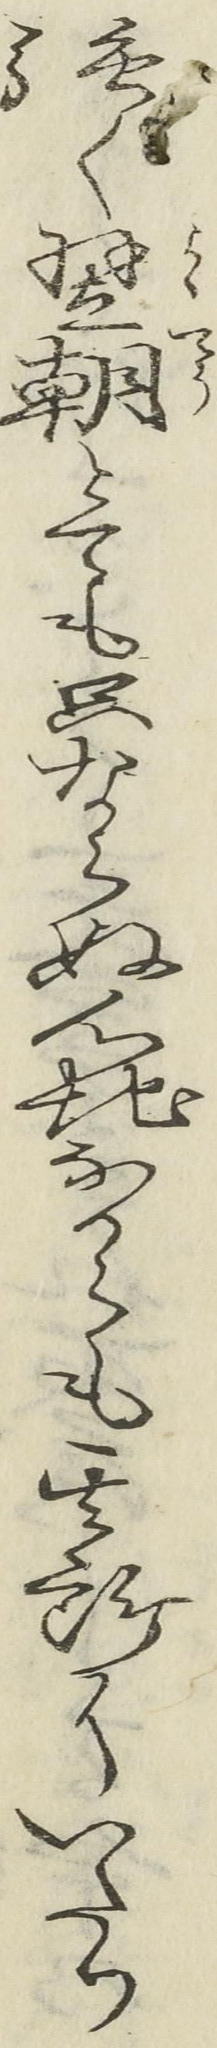強く翌朝とても只ならぬ心地なからも其所にいたり
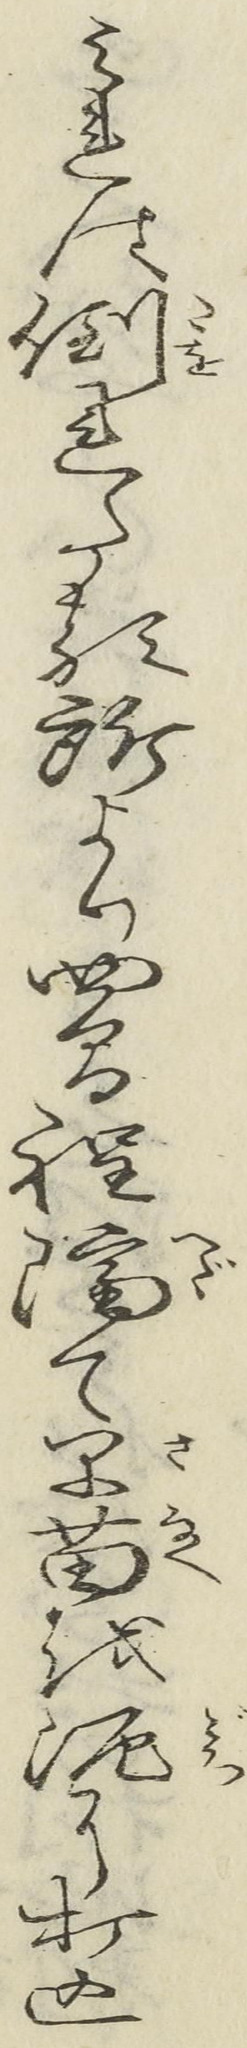みれは倒れる所より四間程隔て早苗を泥に打込
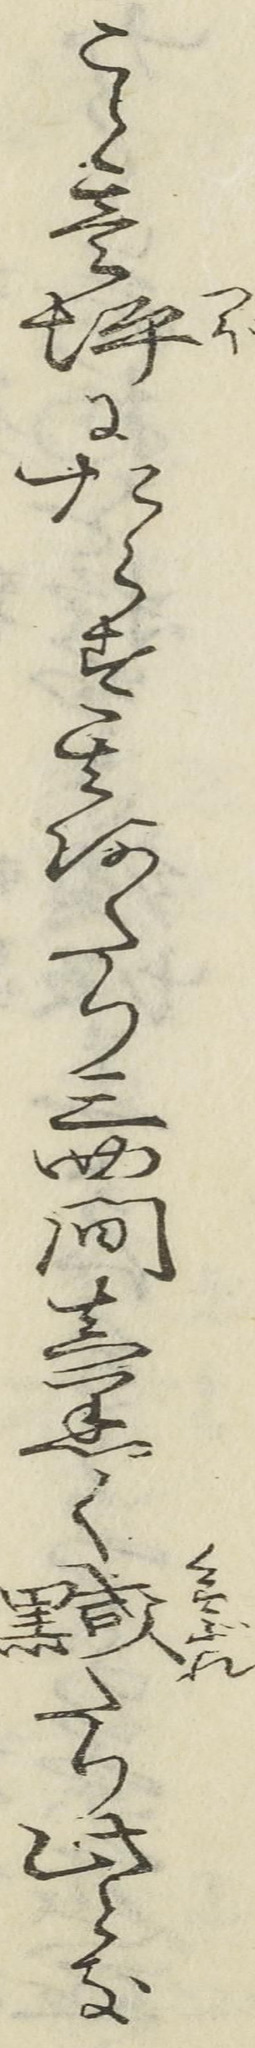こと壱坪にたらす其あたり三四間真黒く黬たり此とき
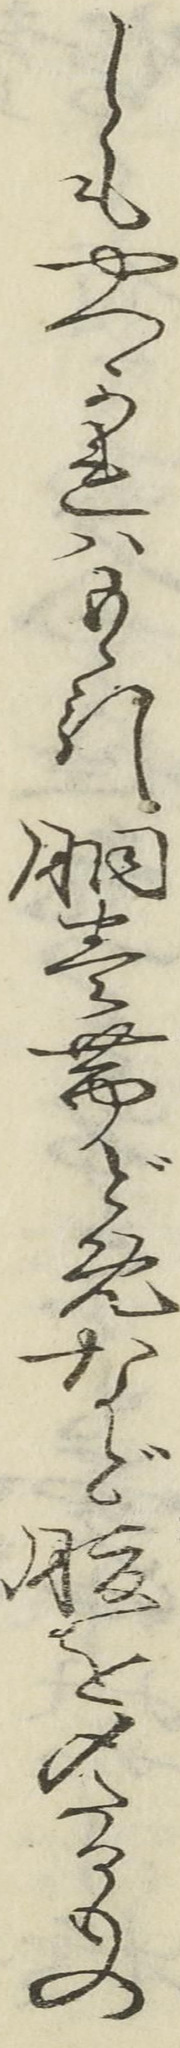しもやつかれはもゝ引胴巻帯どめなど腹を〆たるもの
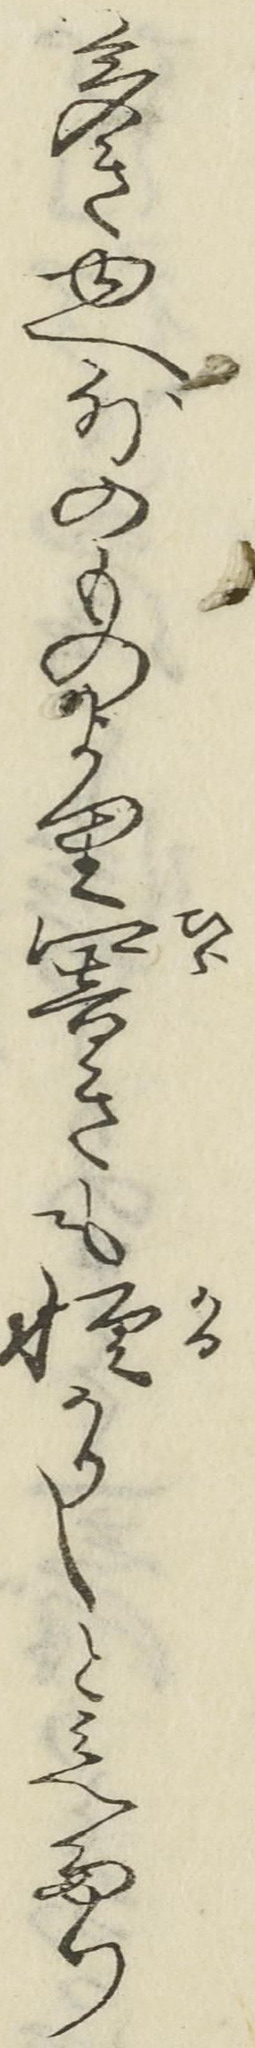多きゆへ外のものより響きも軽かりしとみへたり
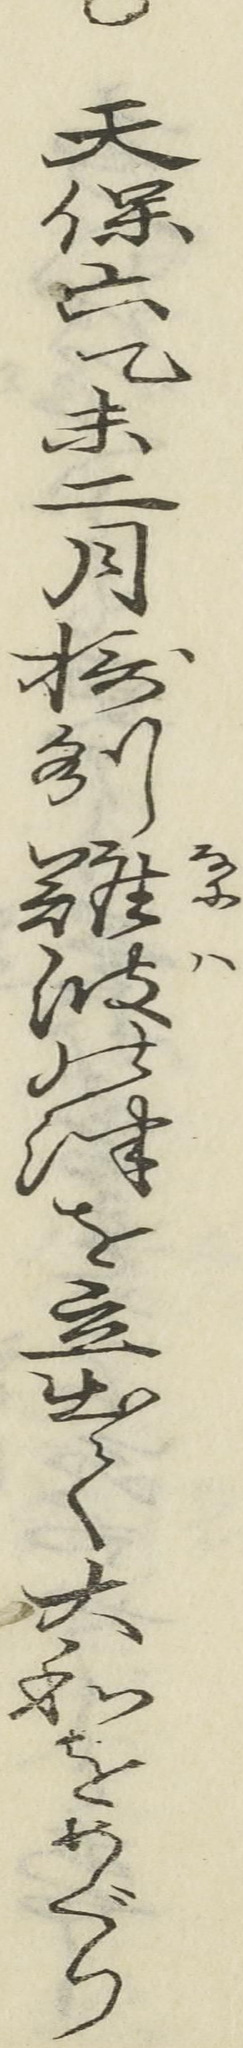〇天保六乙未二月摂州難波の津を立出て大和をめぐり
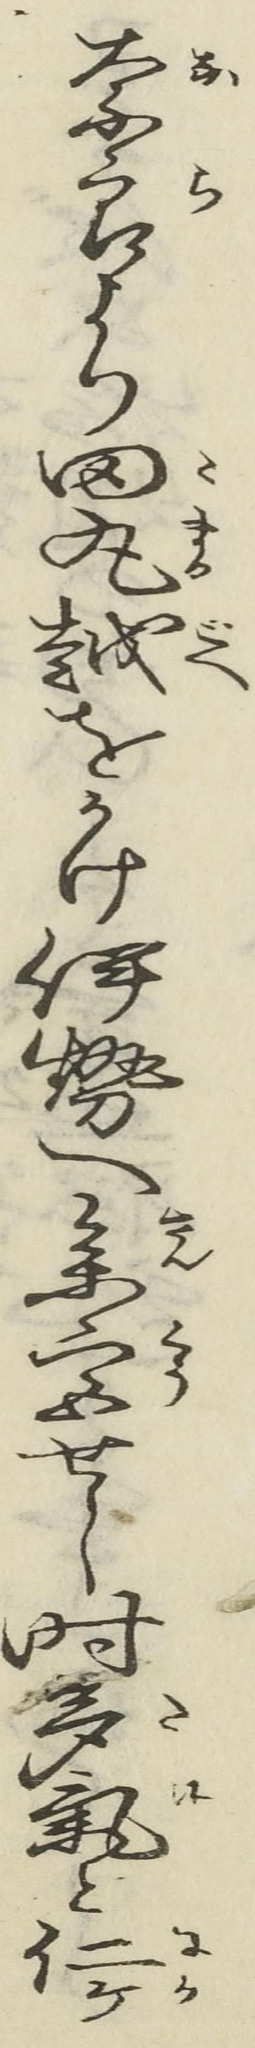奈良より田丸越をかけ伊勢へ参宮せし時多気と仁ヶ
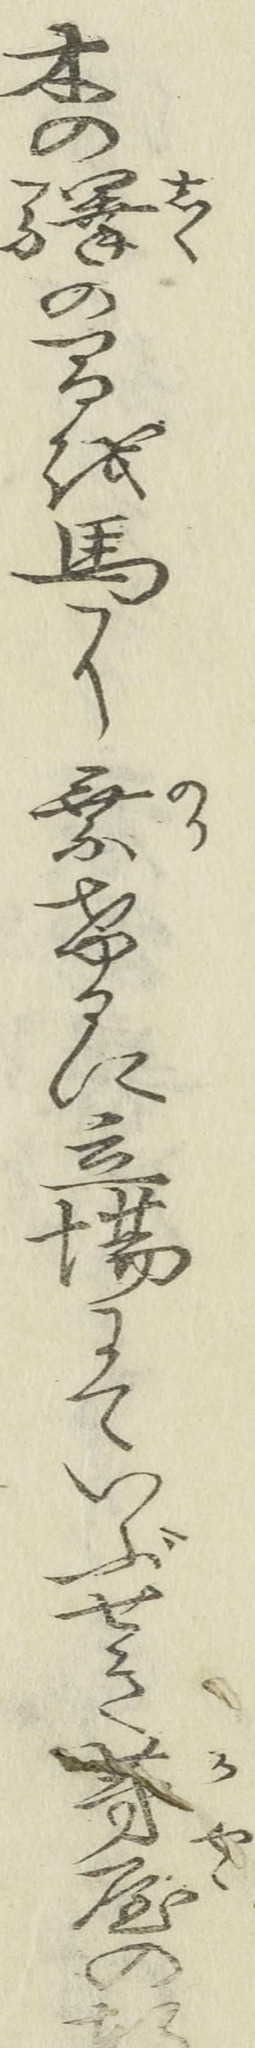木の駅の間を馬に乗けるに立場にていぶせき茅屋の軒
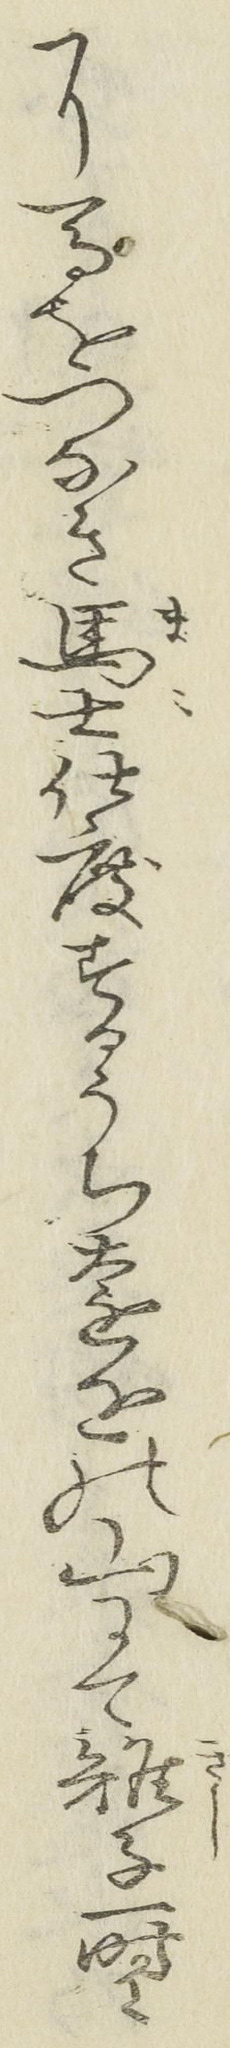に馬をつなき馬士支度するうち遠近の山にて雉子一時に
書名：震雷考説　全
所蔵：東京大学地震研究所図書室 Earthquake Research Institute Library, The University of Tokyo, JAPAN
